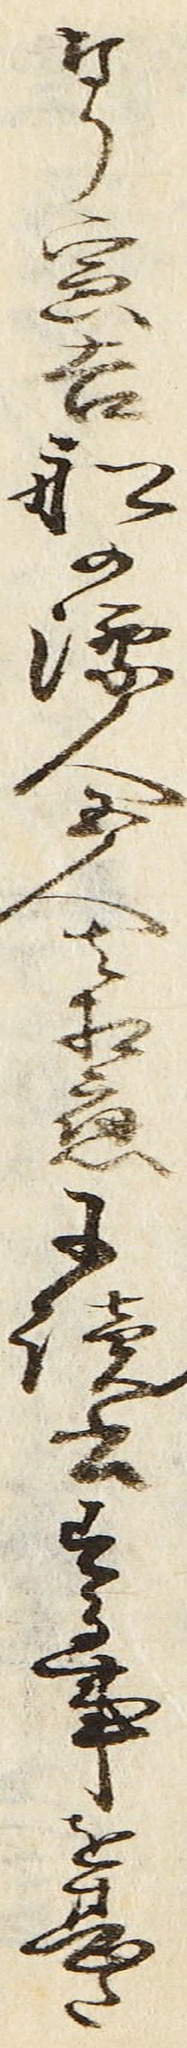なり寅吉船の漂人五人は相応に読書する事を甚た
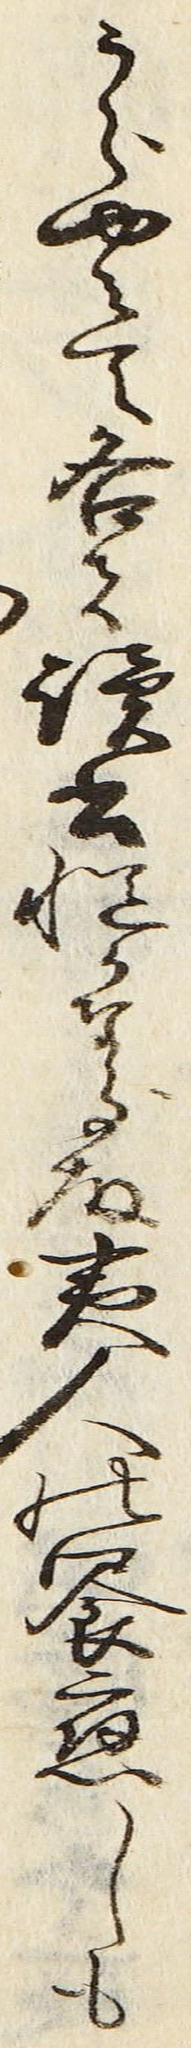うらやミて各は読書慥かなる故夷人の饗応しも
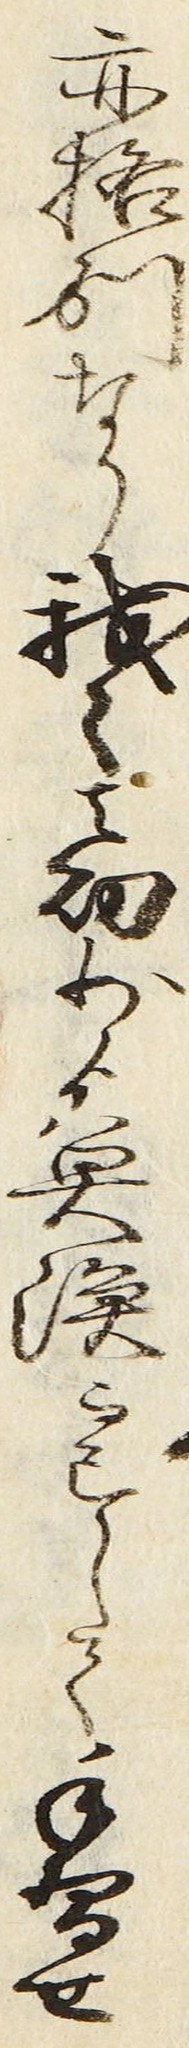亦格別なり我々は幼少ゟ魚漁而已して手習せ
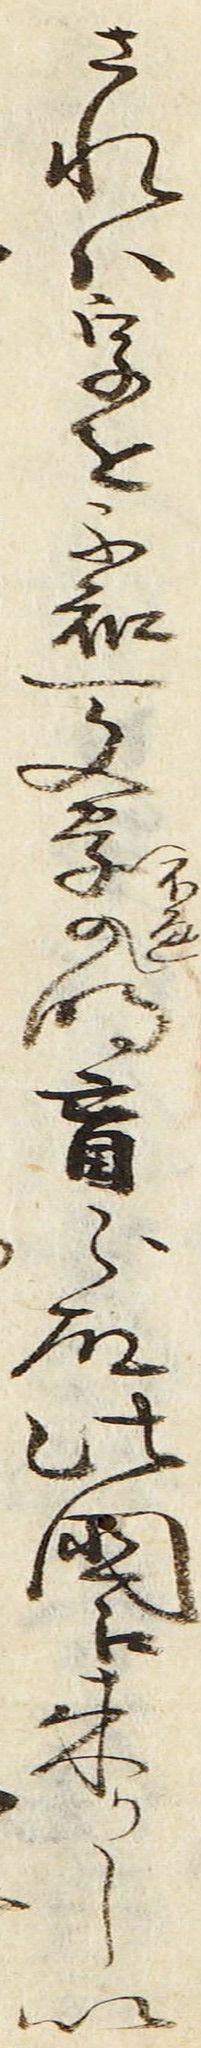されハ字を不知一文字不通の明盲ら故此国え来りし以
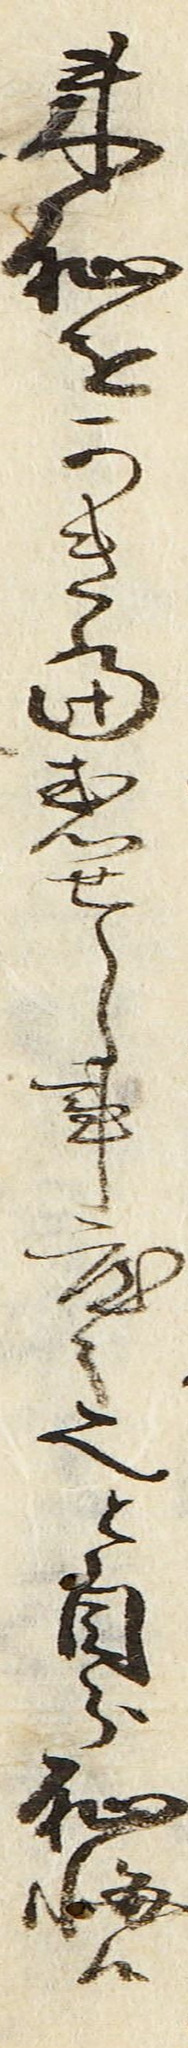来恥をかき当惑せし事度々也と自ら恥悔候
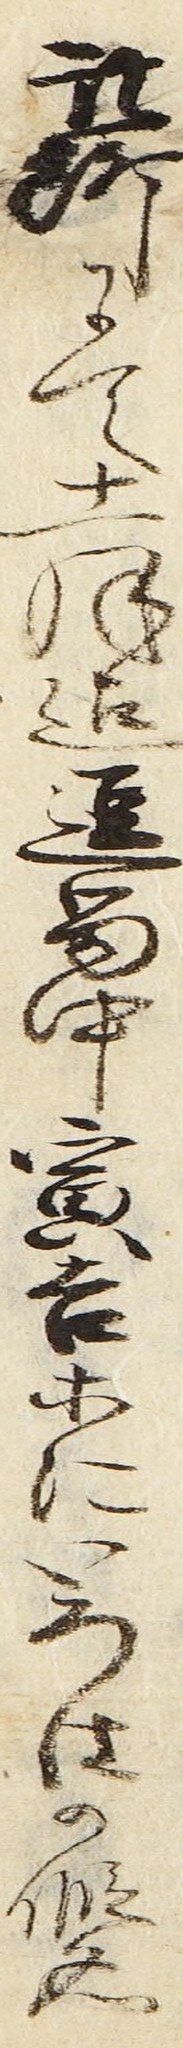此所にて十一月迄逗留中寅吉等にいろはの假名
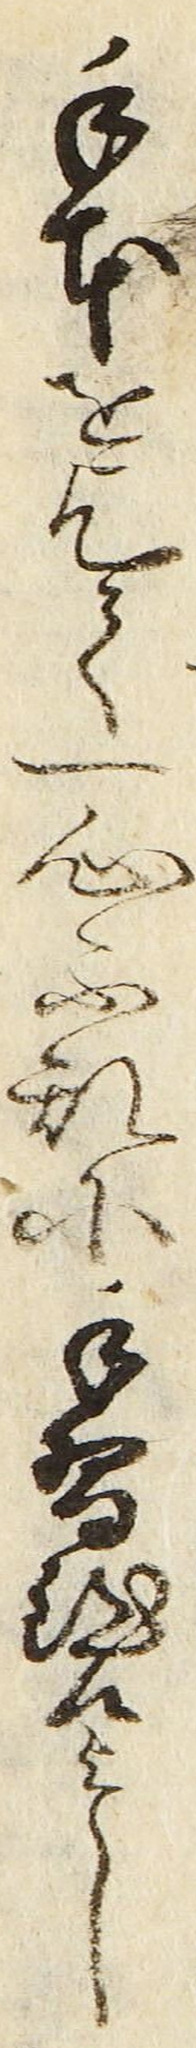手本を乞て一心不乱に手習致候よし

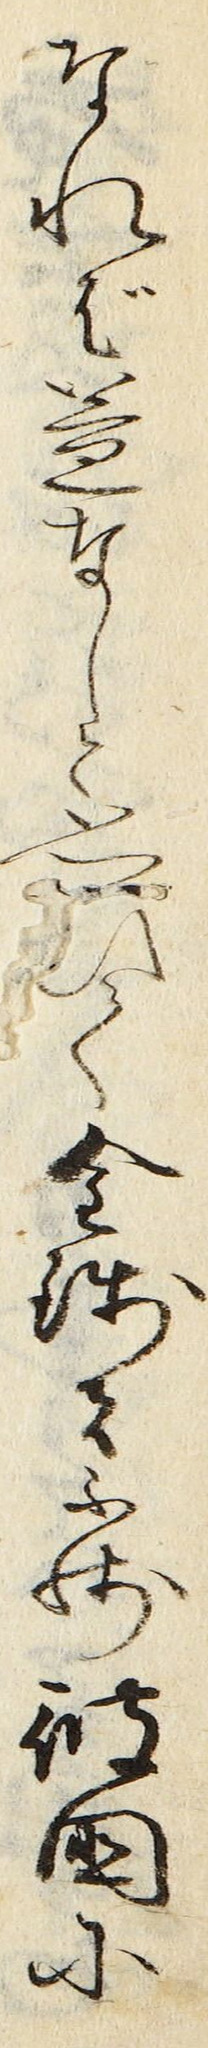なれば益なしと思ひて金銭は不残彼国に
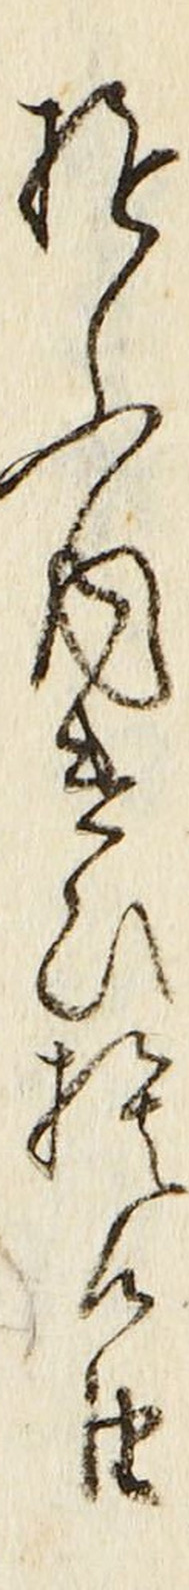遊ふ内遣ひ捨候由
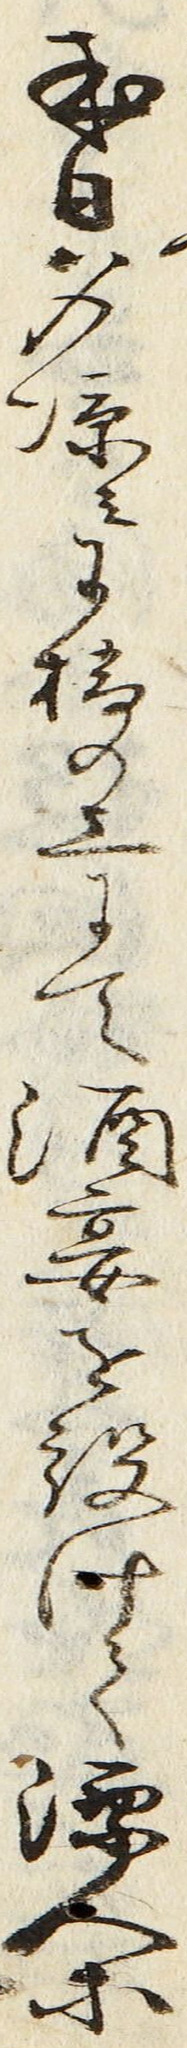或日ハ夕涼ミに橋の上にて酒宴を設けて漂人等
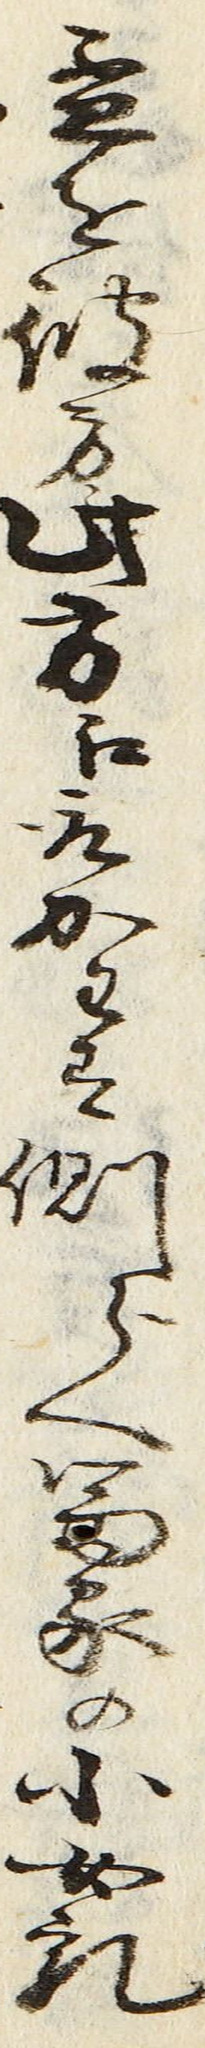盃を彼方此方え取かわす側らへ冨家の小女乳
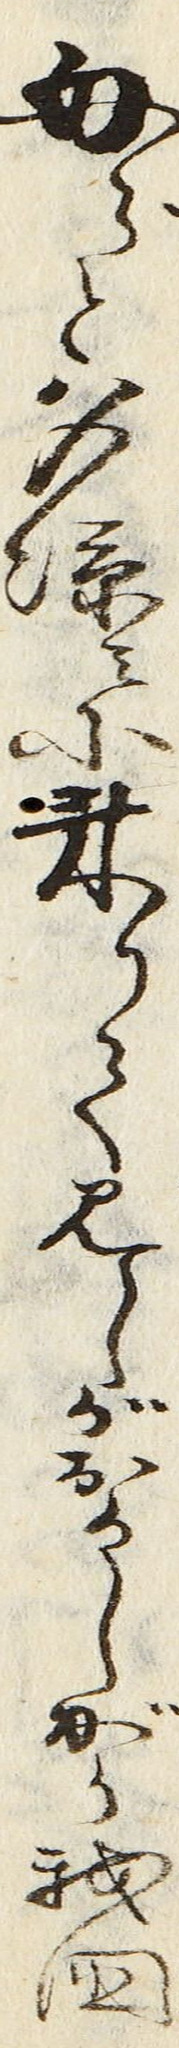母らと夕涼ミに来りて見しがおかしがり我国
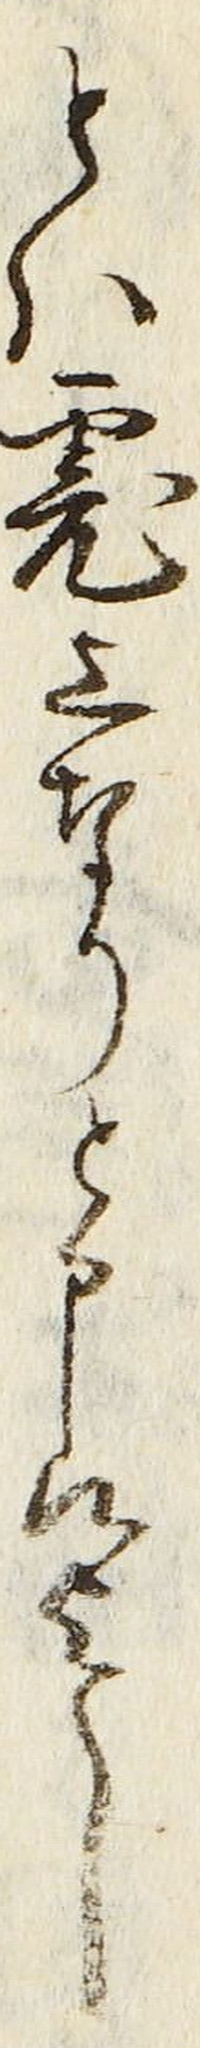とハ上なりと申候よし
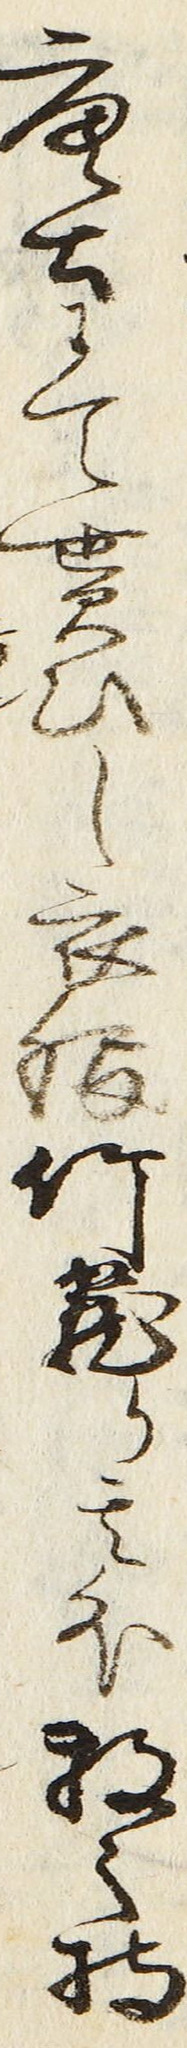唐土にて貰ひし衣服竹籠り其外数々持
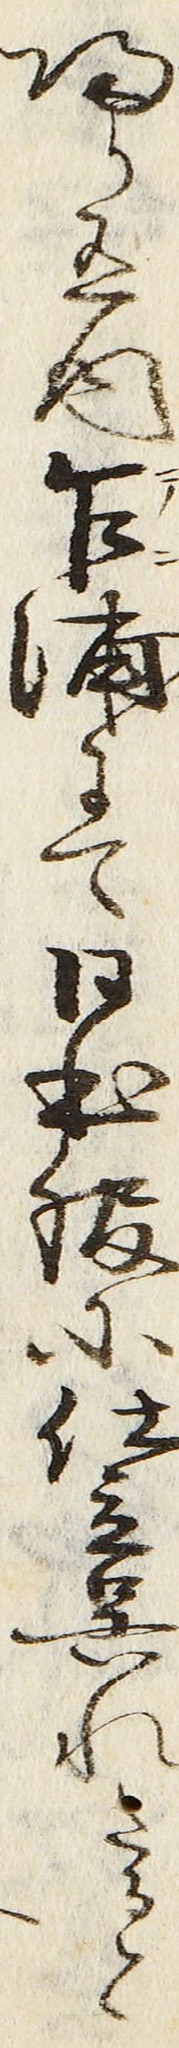帰り其内乍浦にて日本服に仕立呉れたると
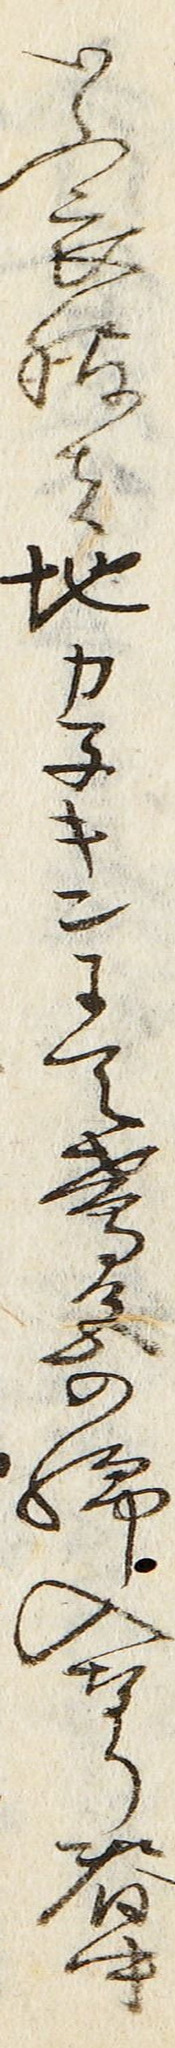いふ衣服は地カネキンにて鳶色の綿入なり背中
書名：亜墨利加漂流記聞
